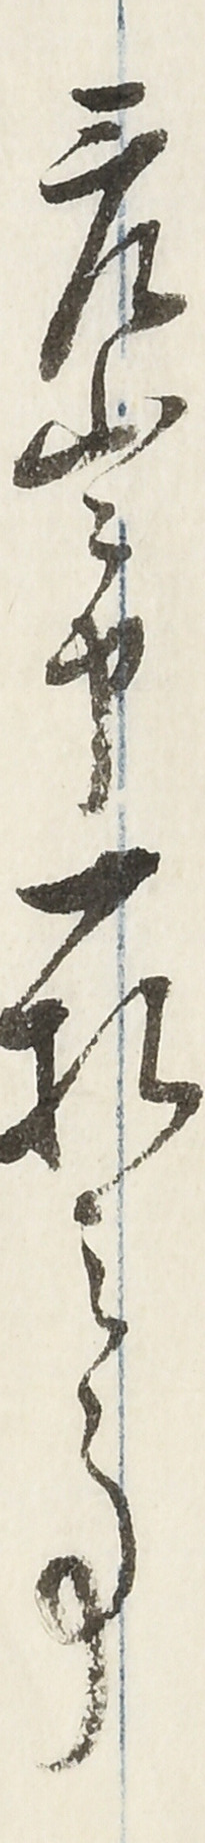差出申一札之事
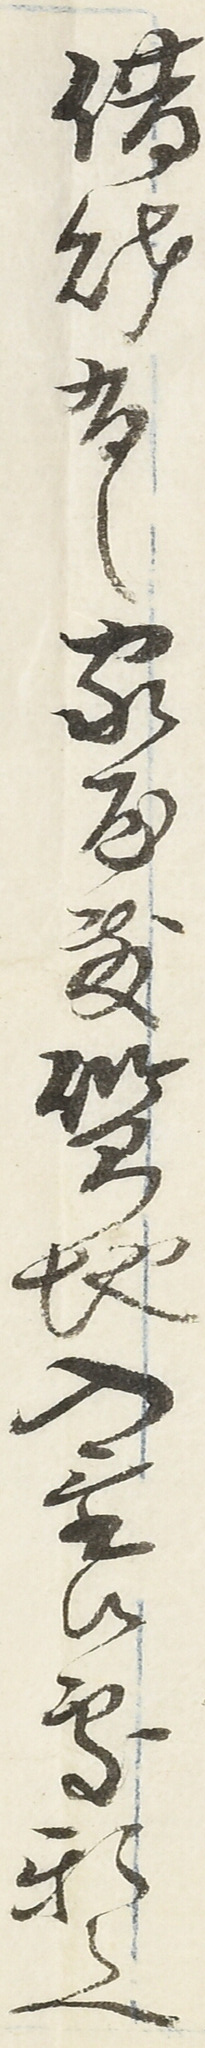借財有之家屋敷質地入置候処新兵へ
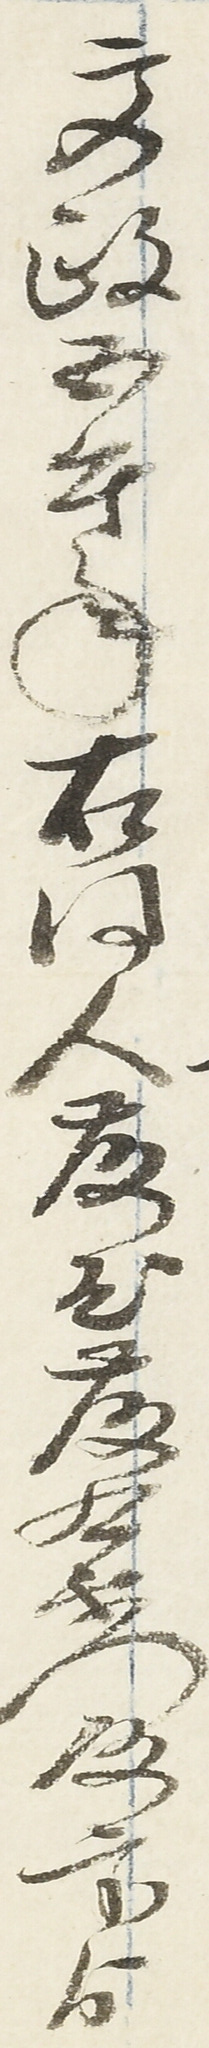文政五午年右同人藤屋藤右衛門殿方ゟ
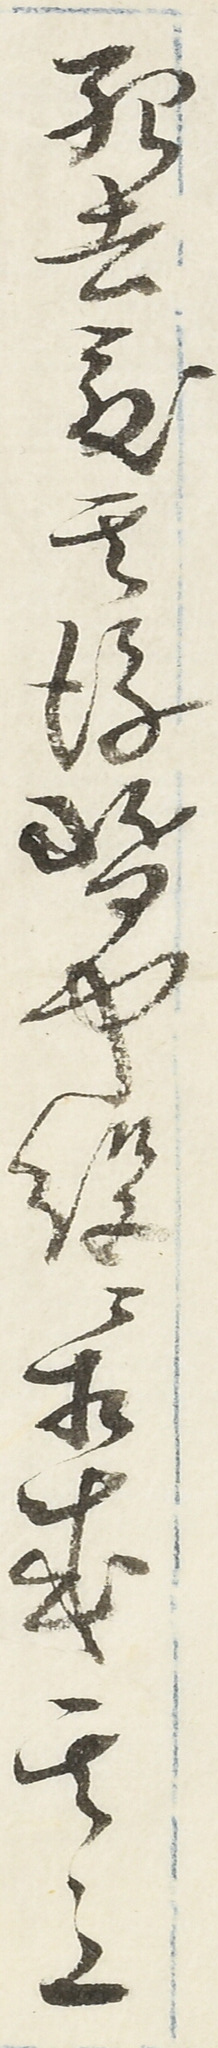死去致其後暫中絶ニ相成其上
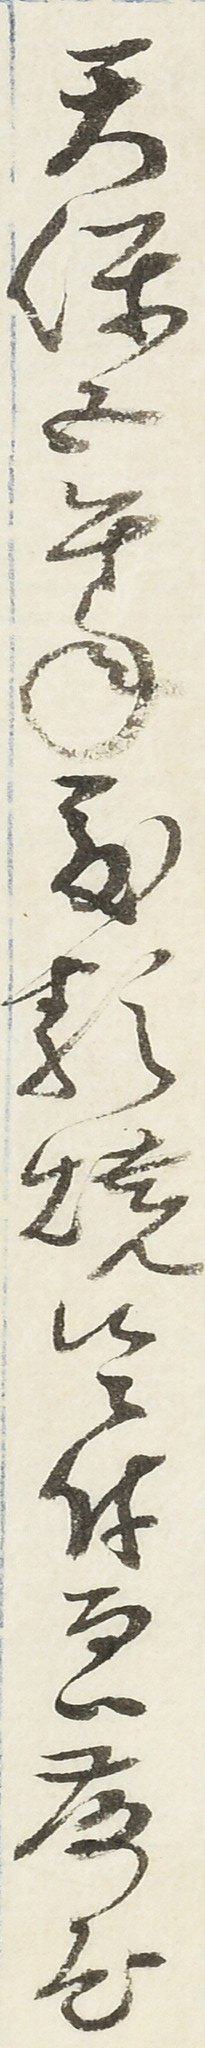天保五午年致類焼候ニ付而ハ藤屋
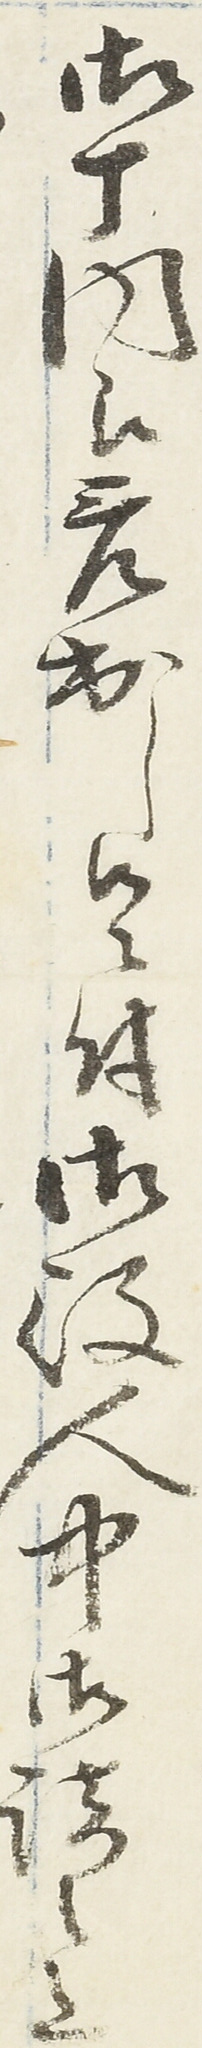御丁内江差出し候ニ付御役人中御談之上
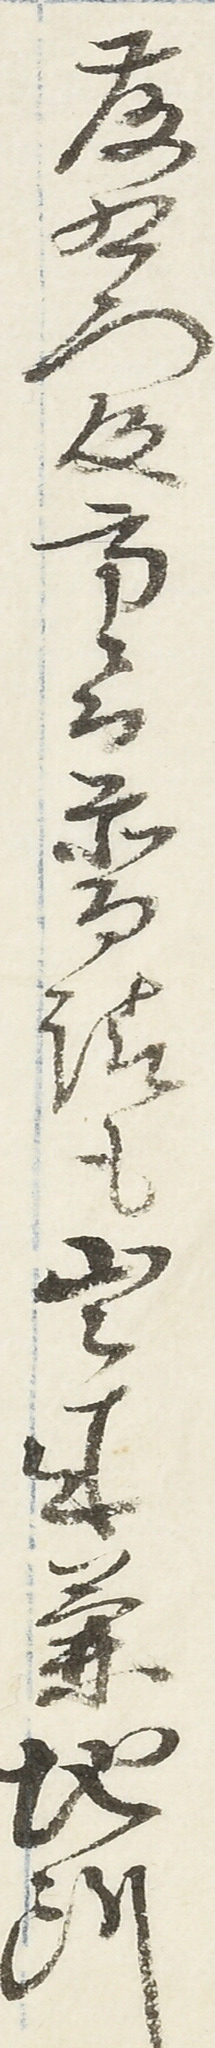藤右衛門殿方ニ而普請も出来兼地所
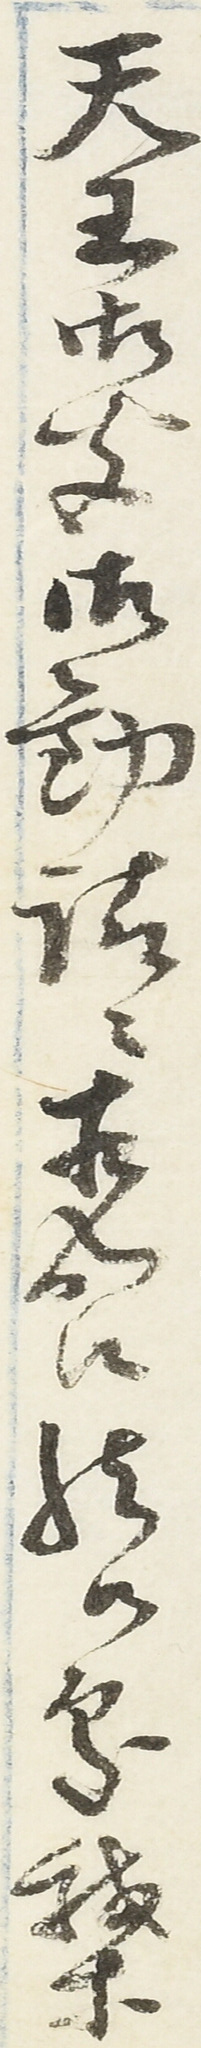天王御宮勧請ニ相成候然ル処我等
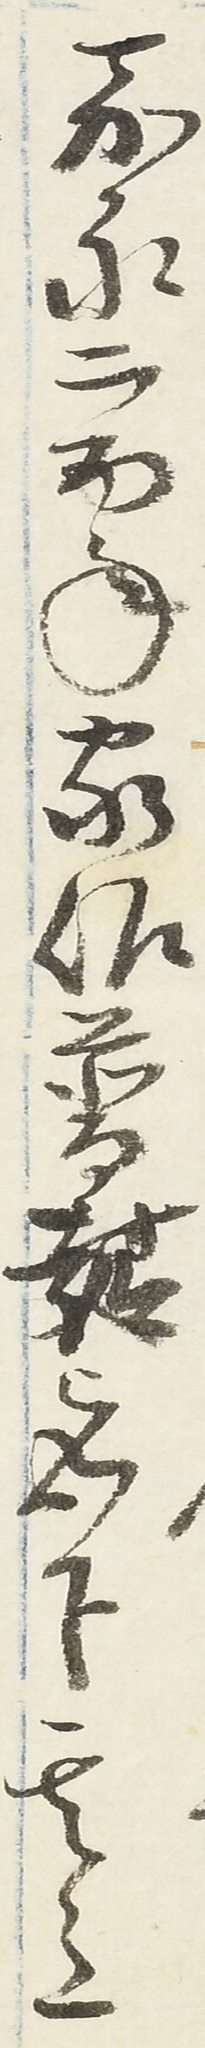嘉永二酉年家作普請被成下其上

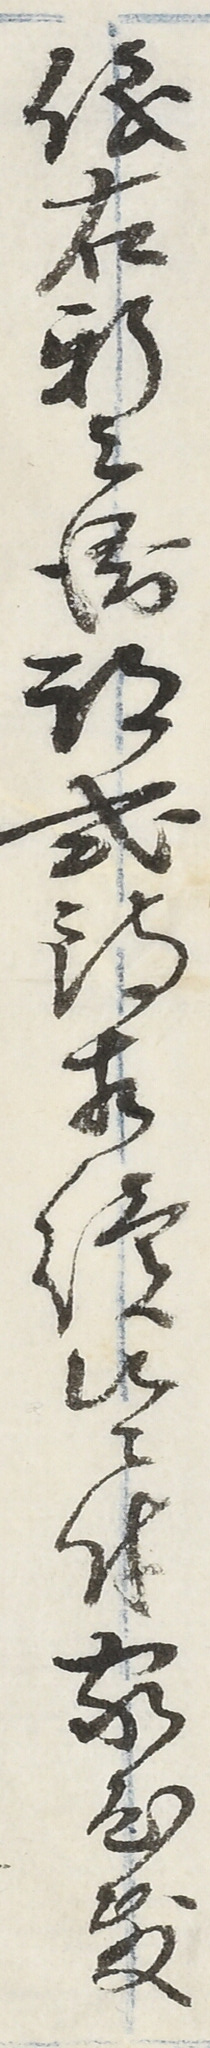儀右新兵衛跡式致相続候ニ付家屋敷
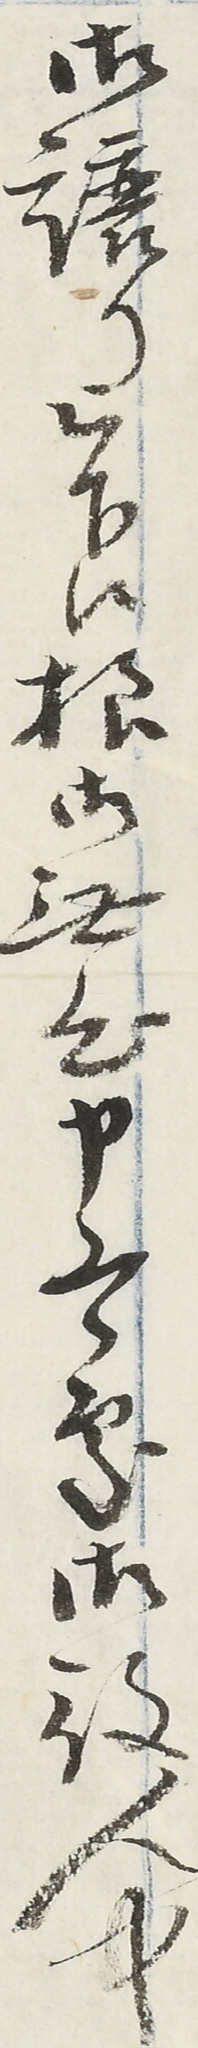御譲り被下候様御無心申上候処御役人中
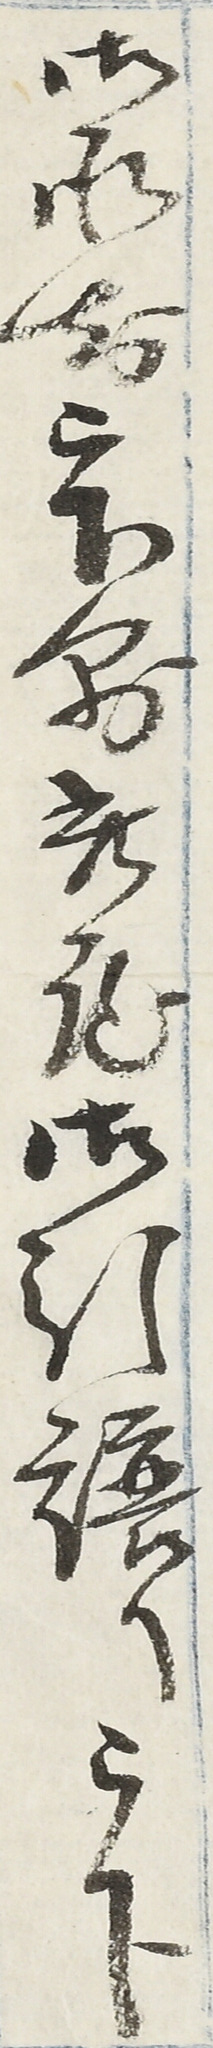御承知被下則此程御引譲り被下
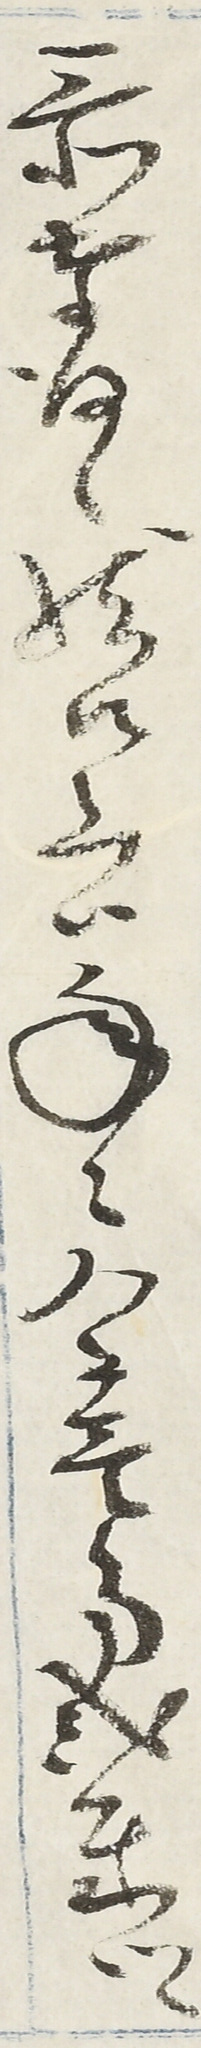忝奉存候然ル上ハ年々金壱分弐朱ツゝ
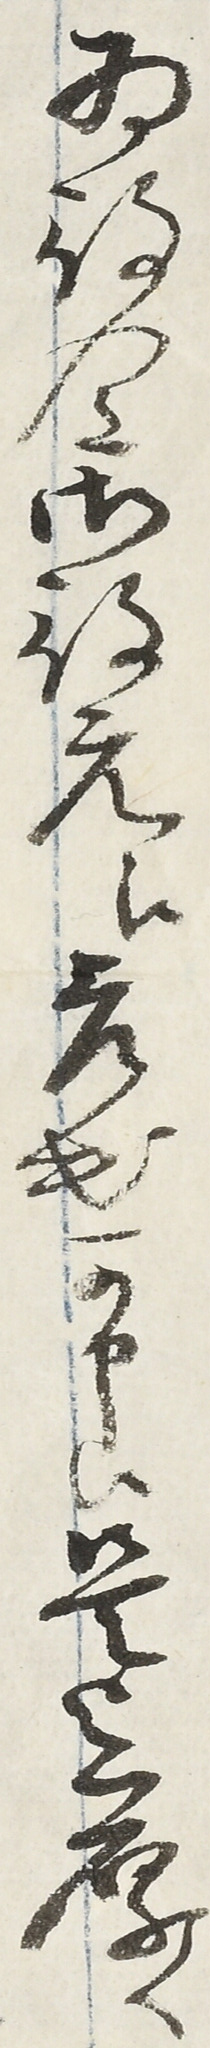為役金御役元江差遣可申候是迄厚く
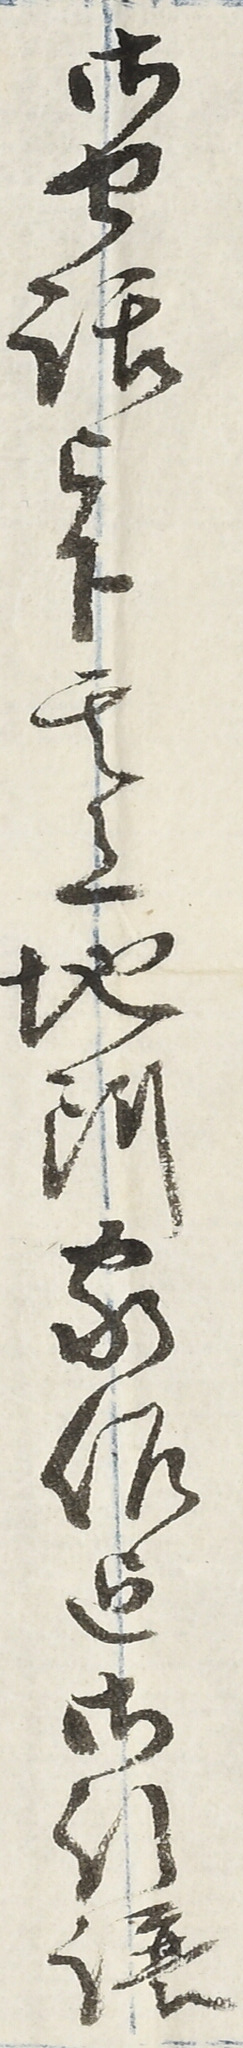御セ話被下其上地所家作迄御引譲
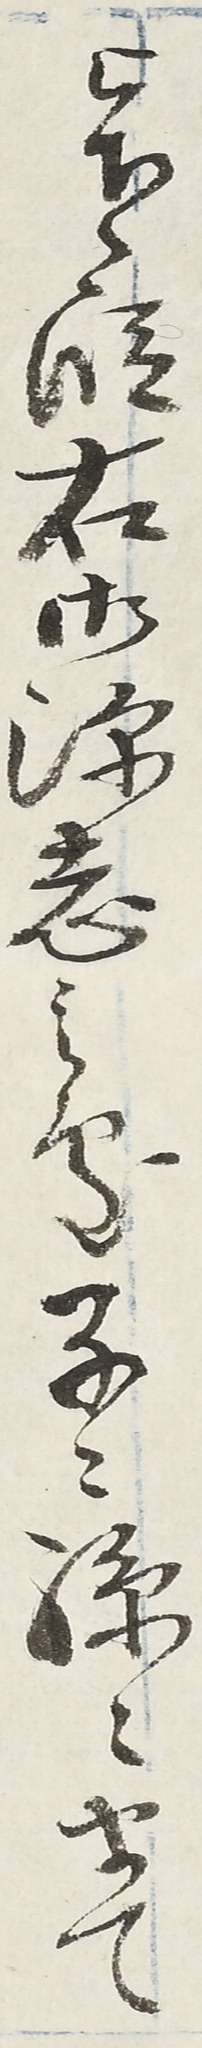被下候段右御深志之処子々孫々まて
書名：差出申一札之事
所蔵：伊那市立高遠町図書館・合同会社AMANE
